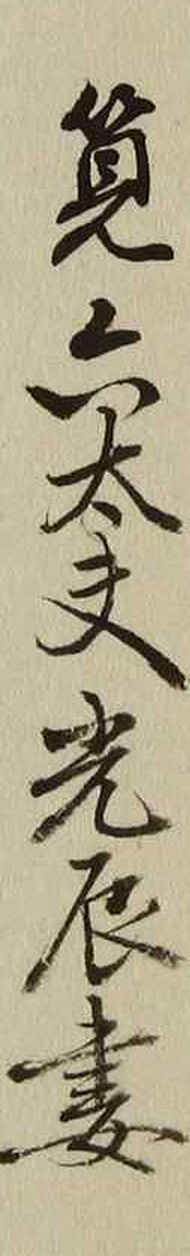筧六太夫光辰妻
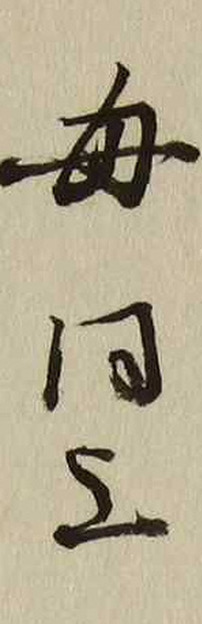母同上
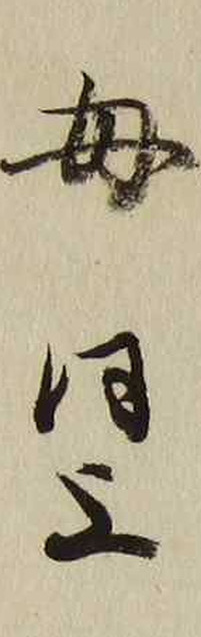母同上

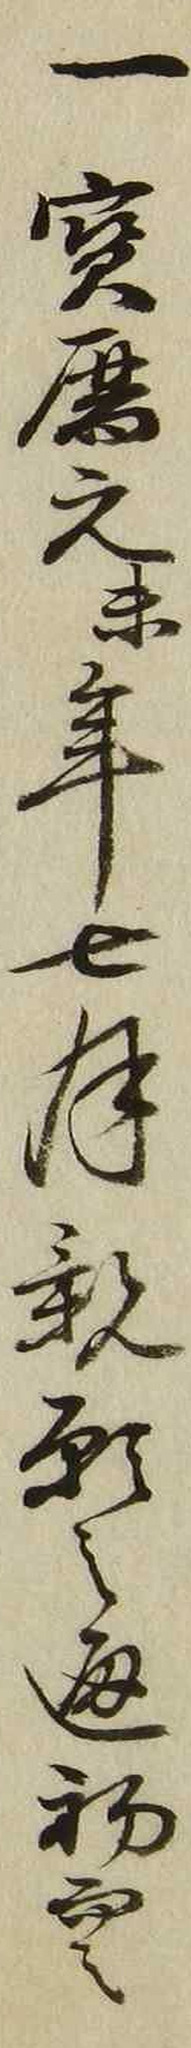一宝暦元未年七月親願之通初而之
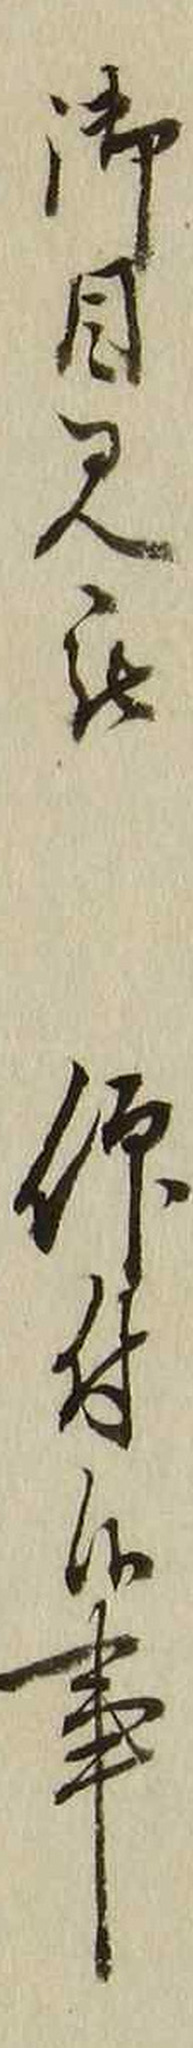御目見被仰付候事
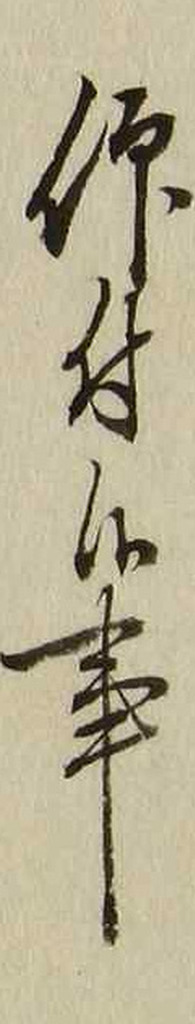仰付候事
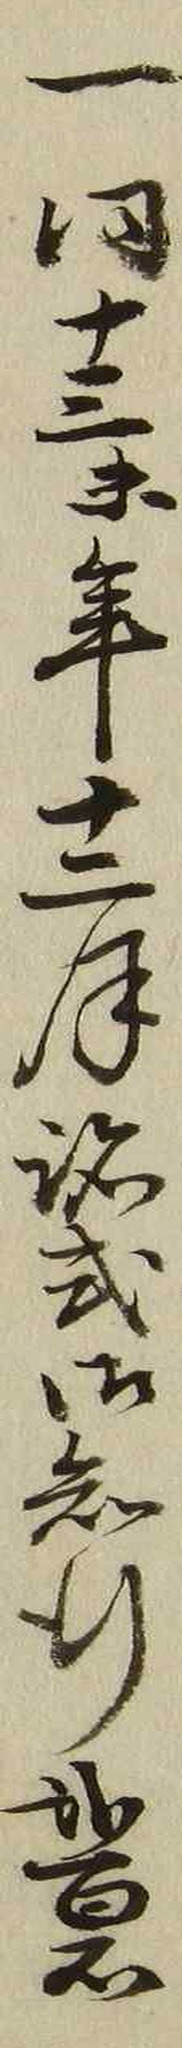一同十三未年十二月跡式御知行弐百石
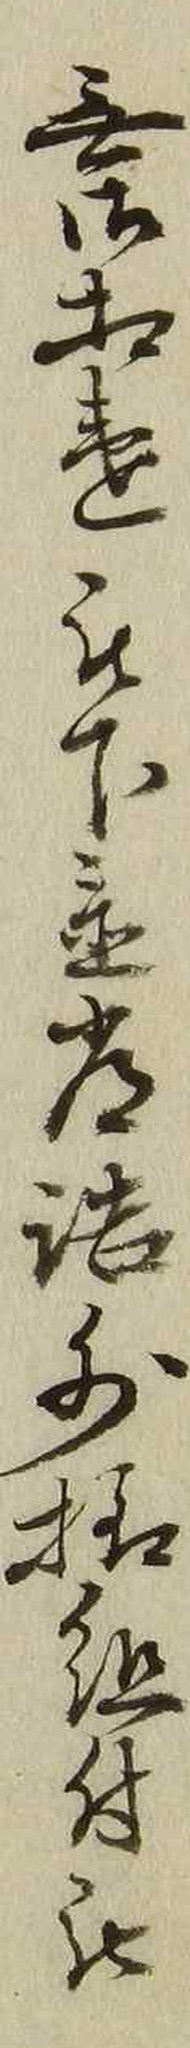無御相違被下置常詰外様組付被
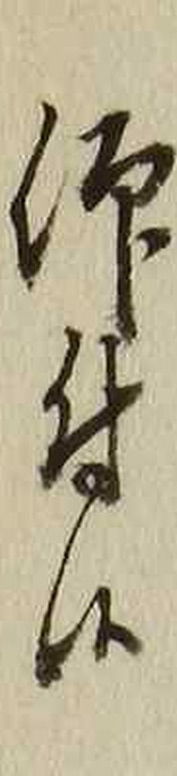仰付候
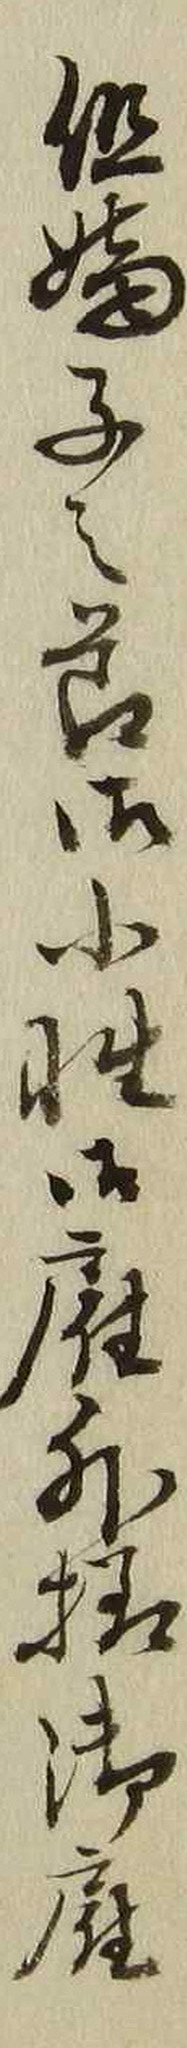但嫡子之節御小性御雇外様御雇
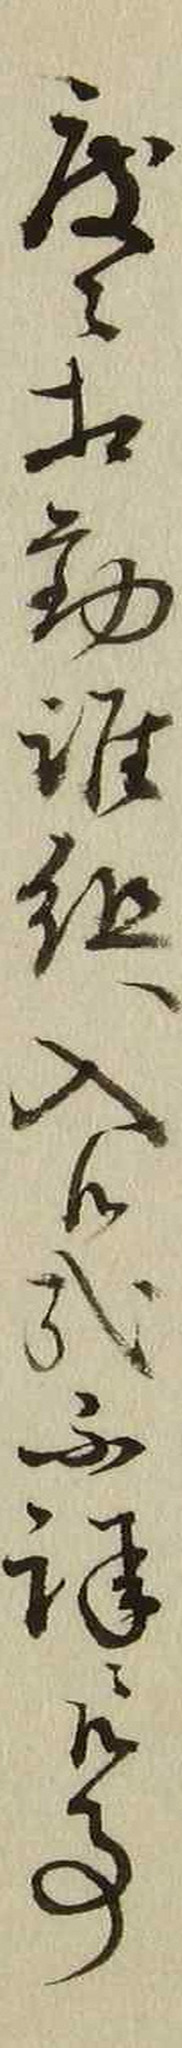度々相動誰組へ入候哉不詳ニ候事
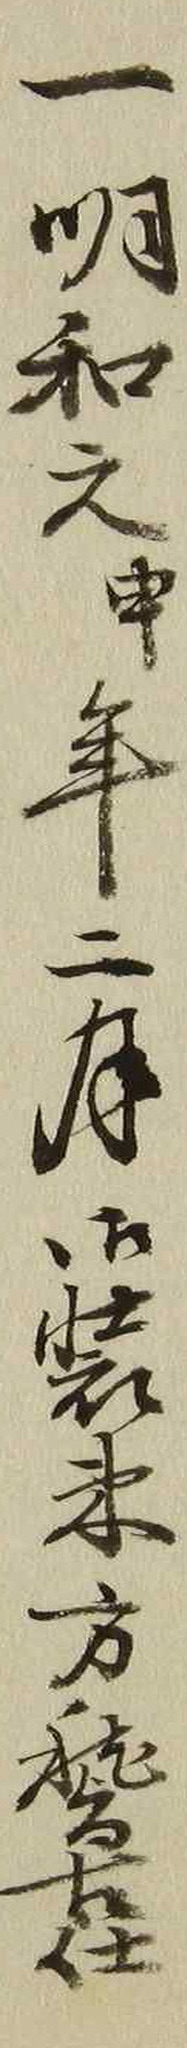一明和元申年二月御装束方稽古仕
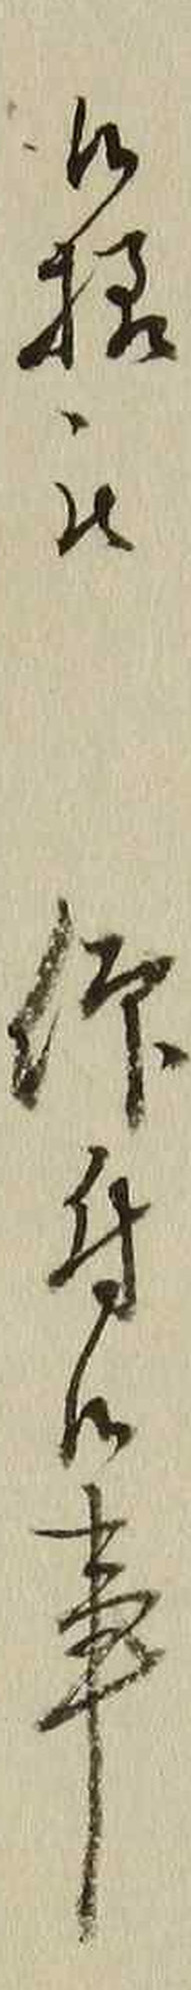候様被仰付候事
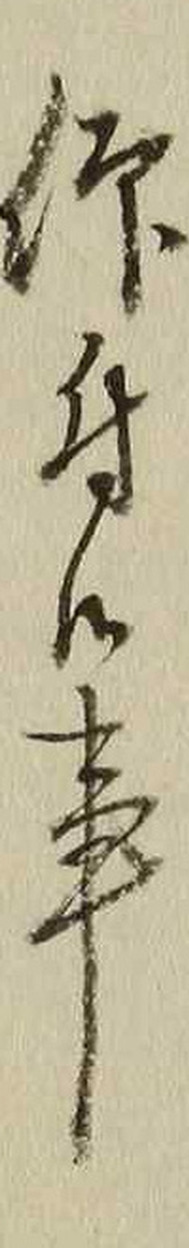仰付候事
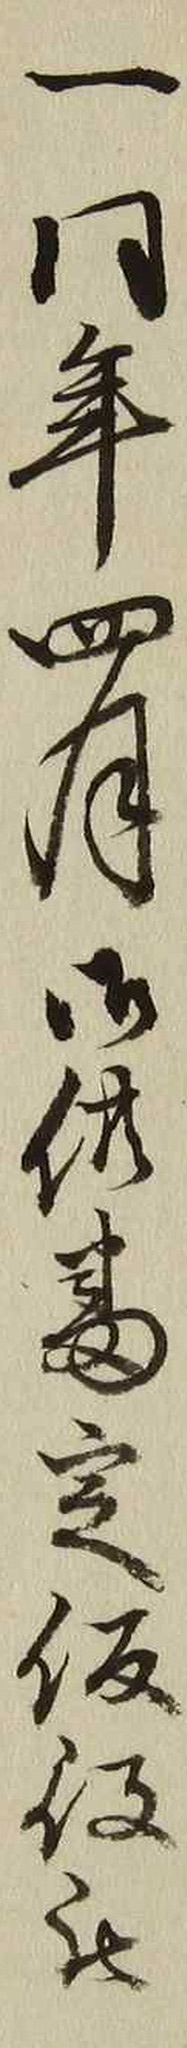一同年四月御供番定仮役被
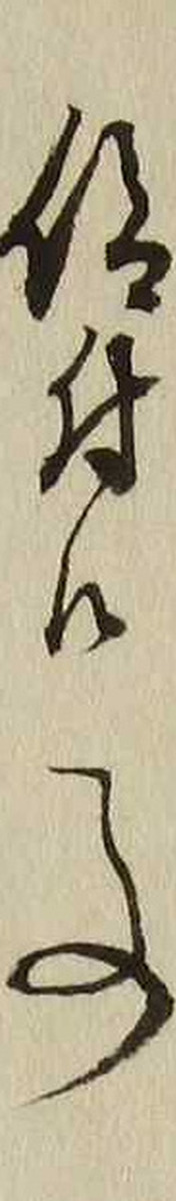仰付候事
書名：諸士系譜　巻之35　は之部3
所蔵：会津若松市立会津図書館
